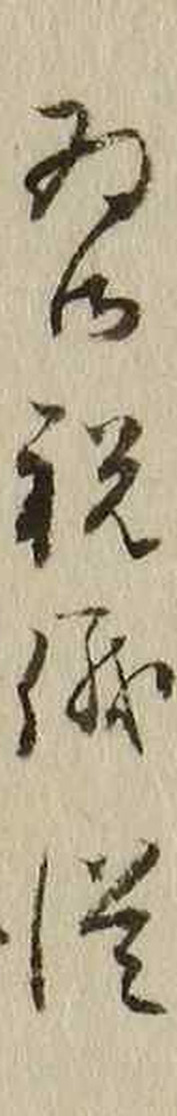為御祝儀従
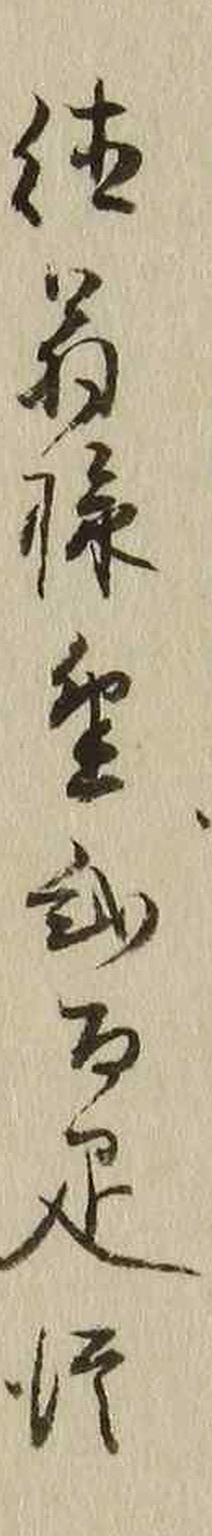徳翁様金弐百疋従
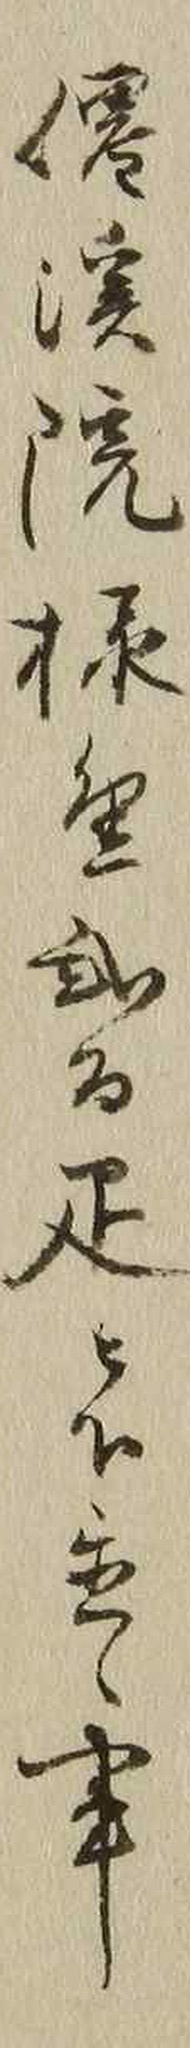仙渓院様金弐百疋被下置候事
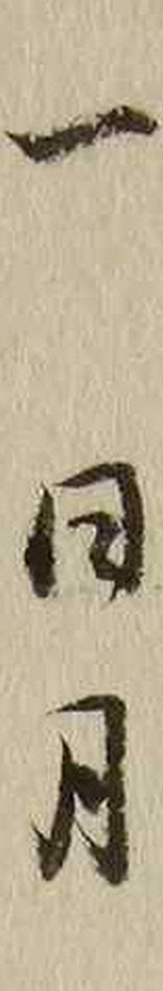一同月
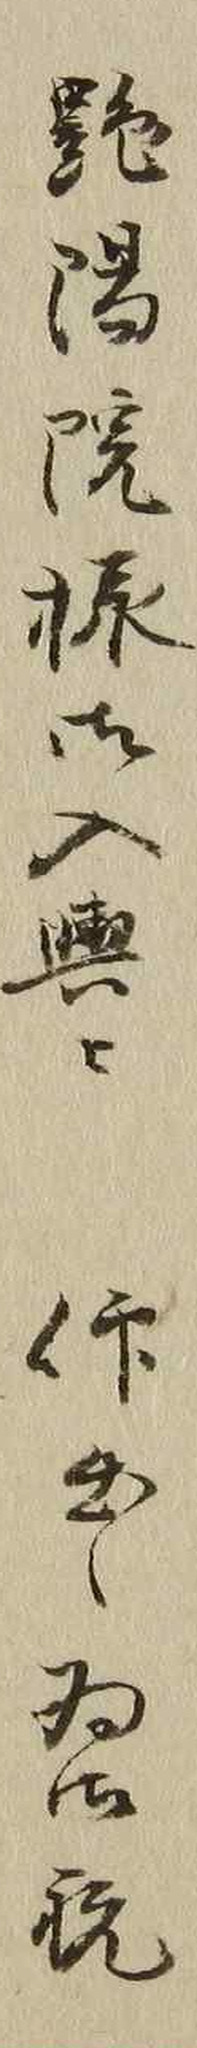艶陽院様御入輿被仰出候為御祝
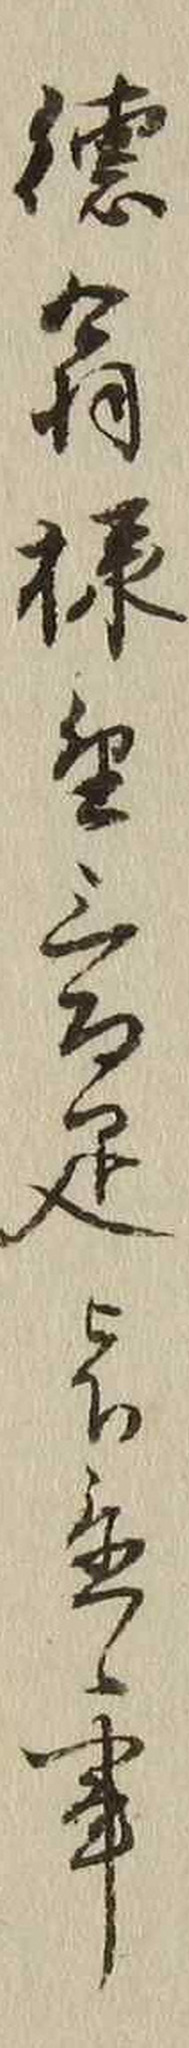徳翁様金三百疋被下置候事
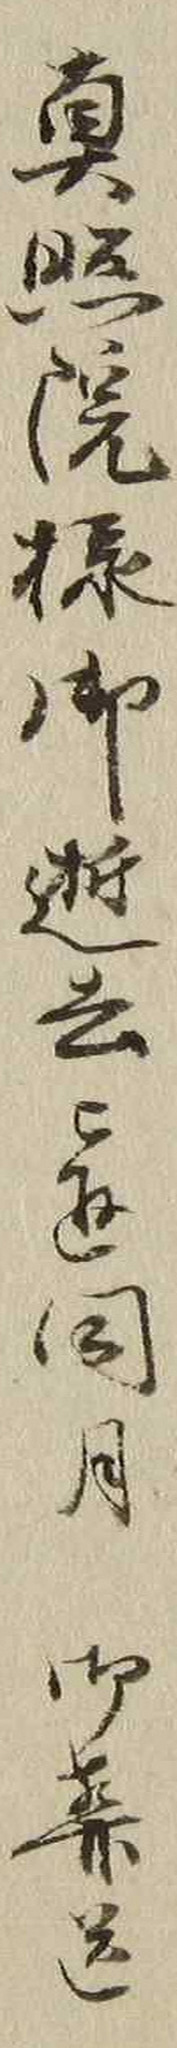真照院様御逝去被遊同月御葬送
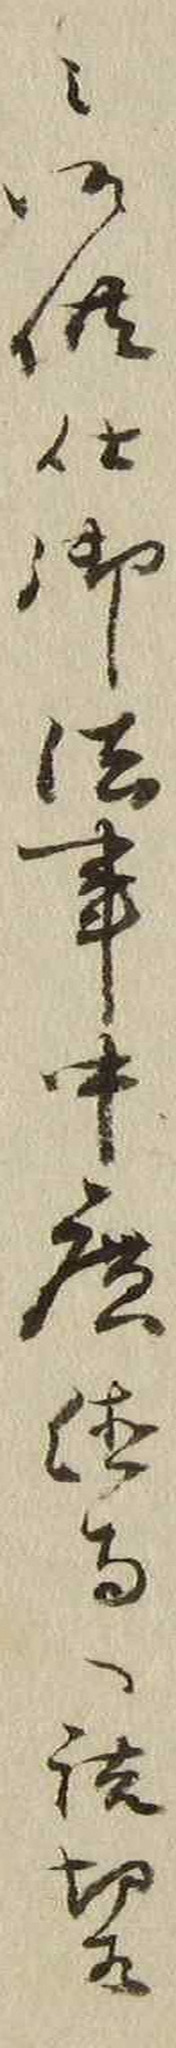之御供仕御法事中広徳寺へ詰切相
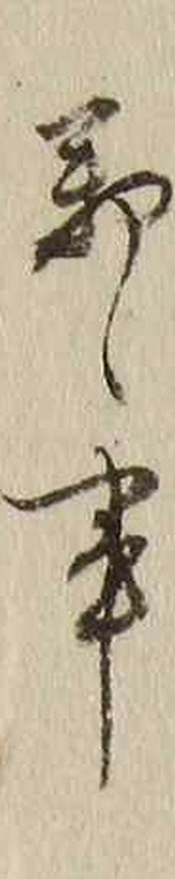勤候事
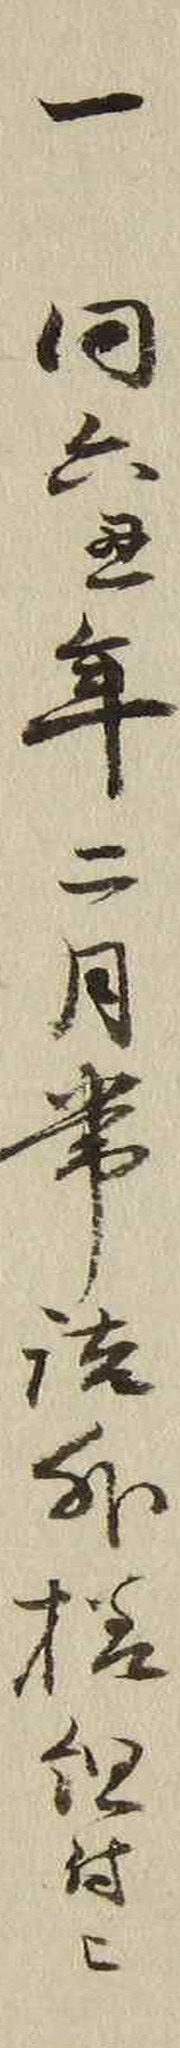一同六丑年二月常詰外様組付被
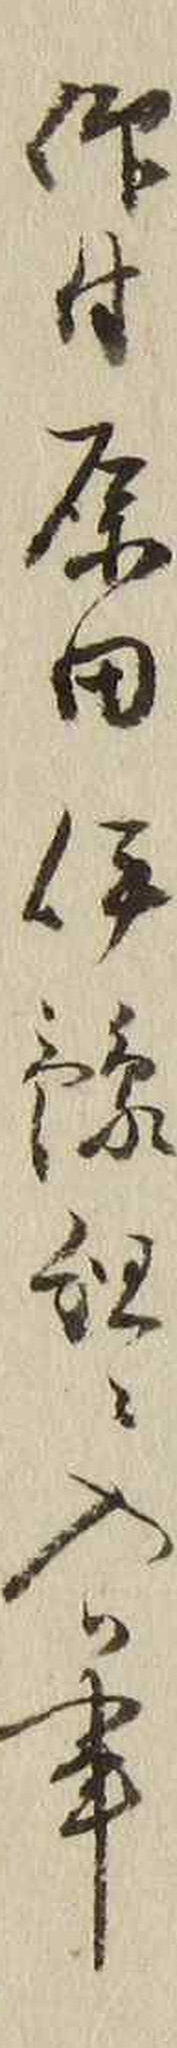仰付原田伊予組ニ入候事
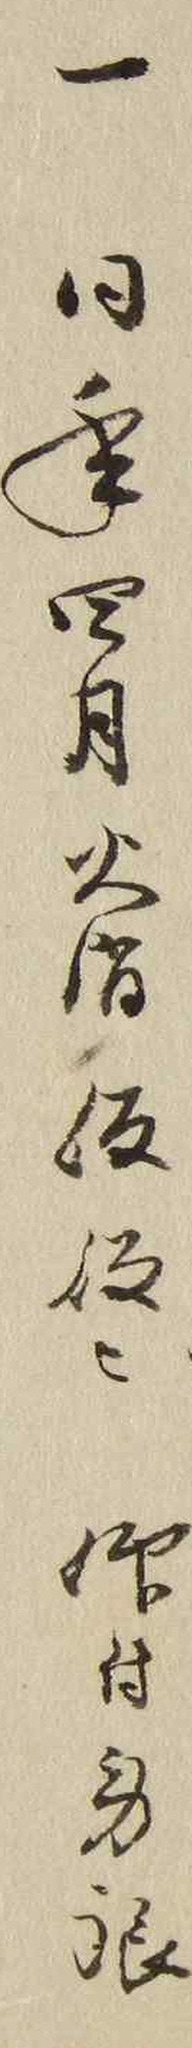一同年四月火消仮役被仰付労銀
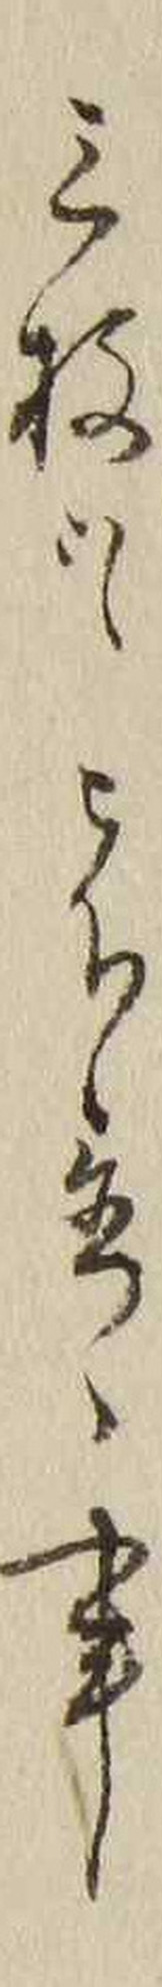三枚ツヽ被下置候事

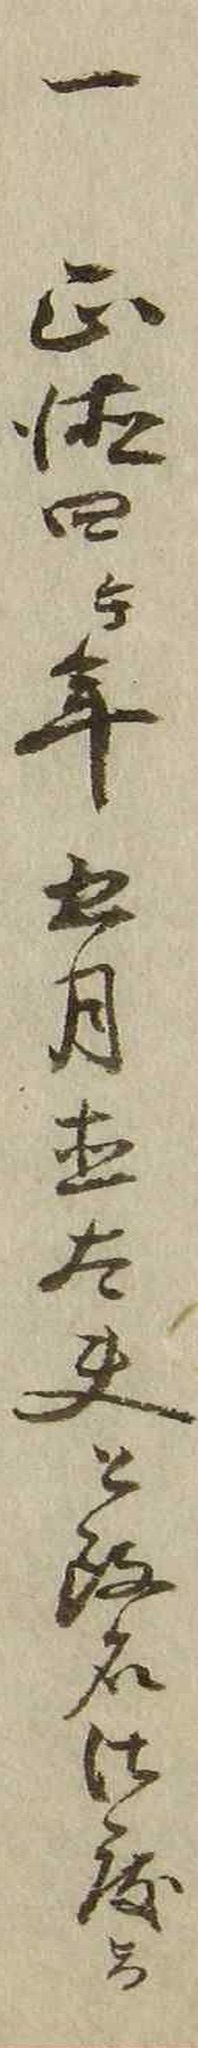一正徳四午年五月直太夫と改名仕度旨
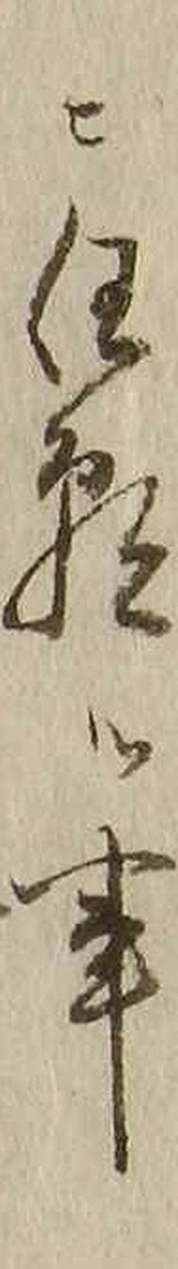被任願候事
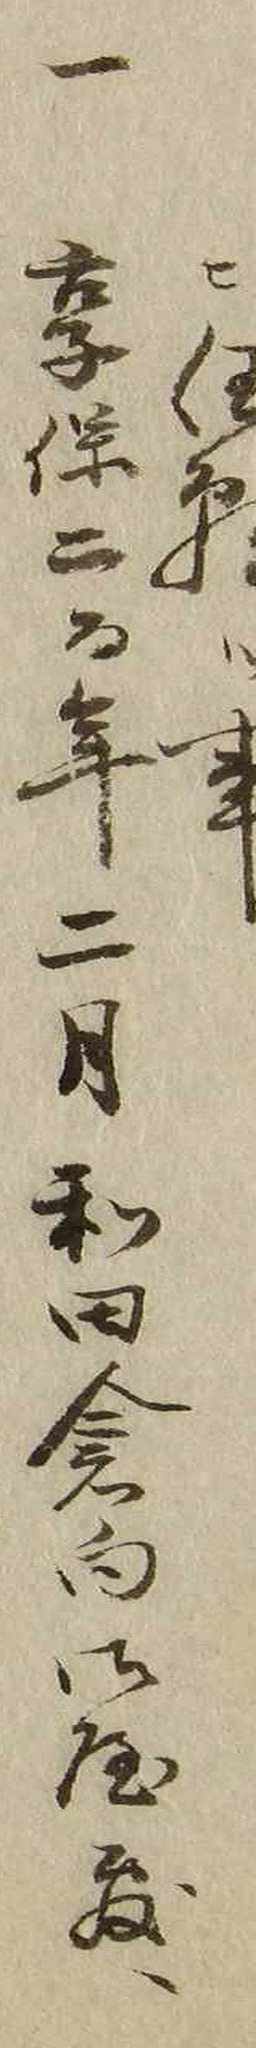一享保二酉年二月和田倉向御屋敷へ
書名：諸士系譜　巻之225　ま之部6
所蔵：会津若松市立会津図書館
